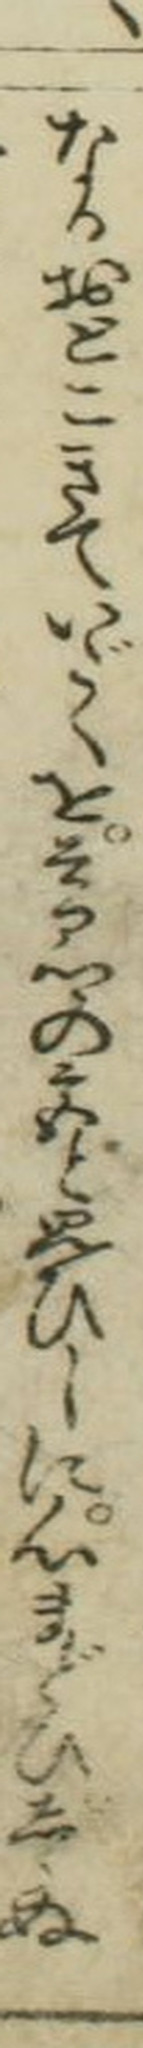なるおとこきていごくを。兵部卿の宮と思ひしに。心まどひしらぬ
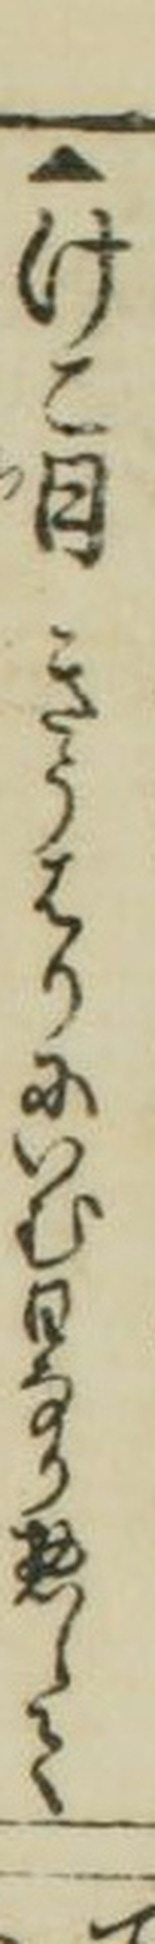▲けこ日きうはりにいむ日なり惣して
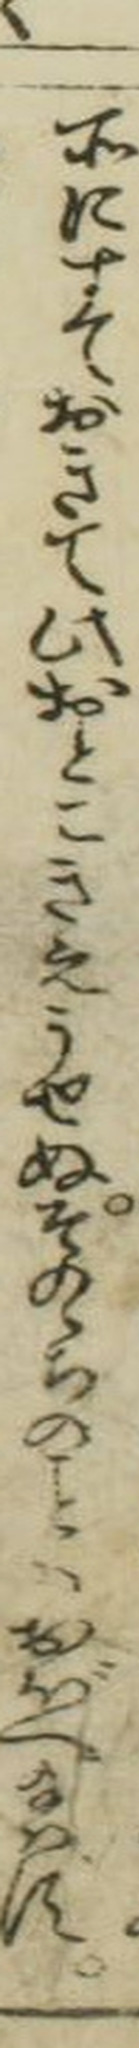所にすておきて此おとこきえうせぬ。そのゝちのことはおぼへ給はす。
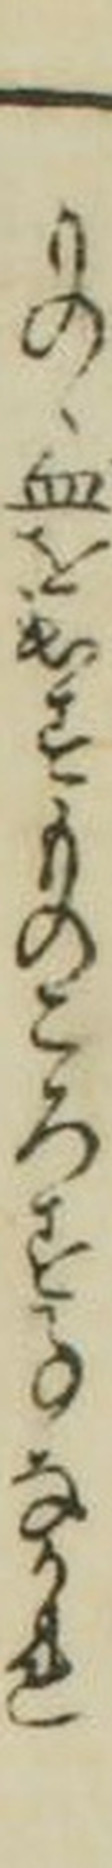ものゝ血を出すものころす事なかれ
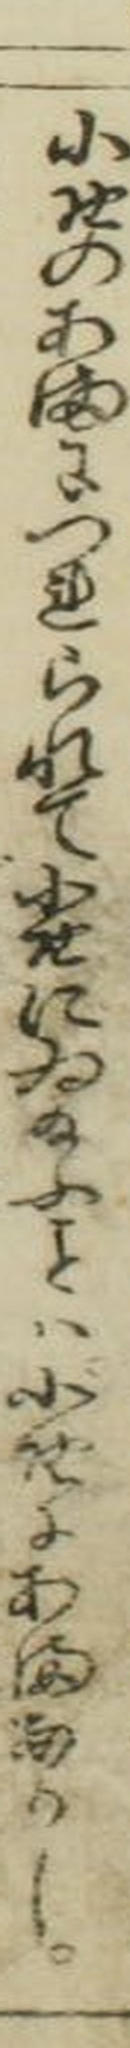小野のあまにつれられて小野に居給ふことは。小野にあまありし。
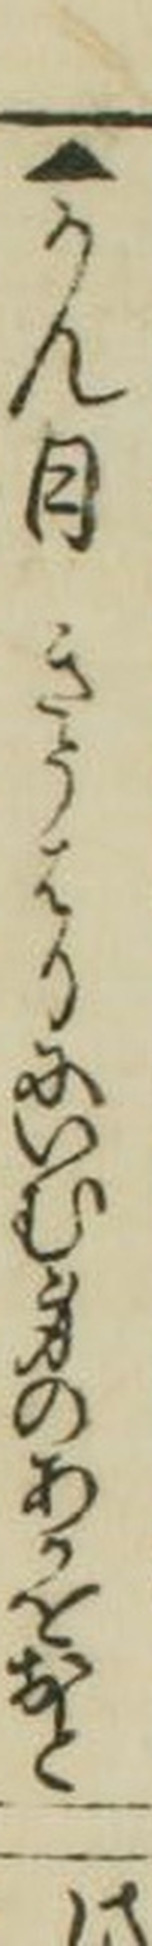▲かん日きうはりにいむ身のあかをおと
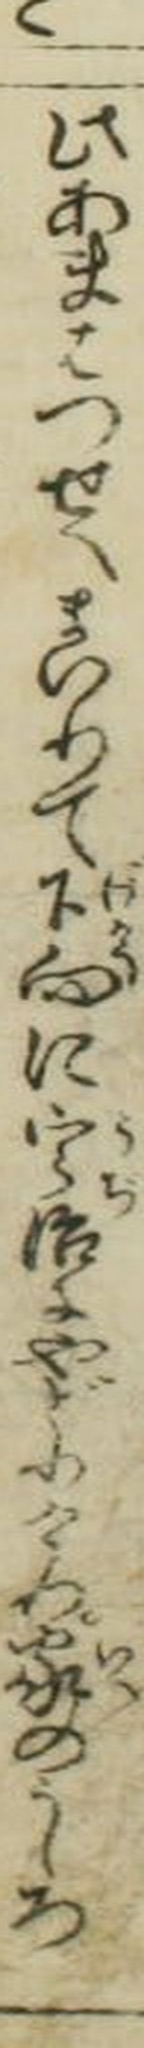此あまはつせへまいりて下向に宇治にやどりけり。家のうしろ
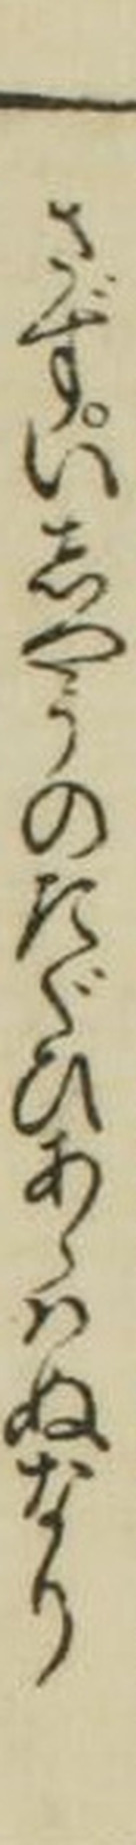さず。いしやうのたぐひあらはぬなり
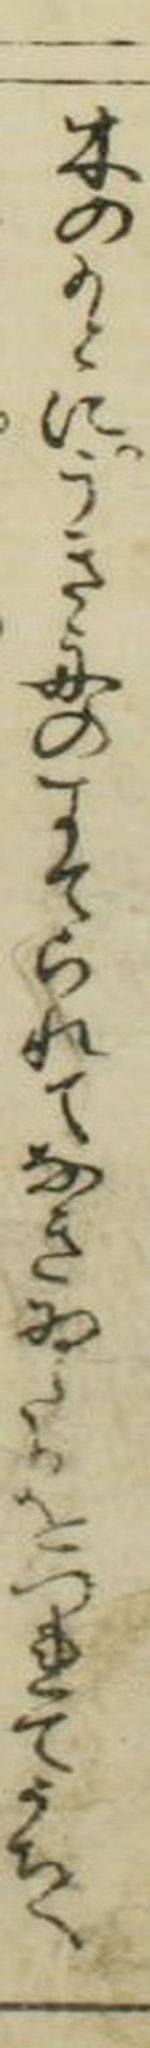木のもとに。うき舟のすてられてなき居たるをつれてうちへ
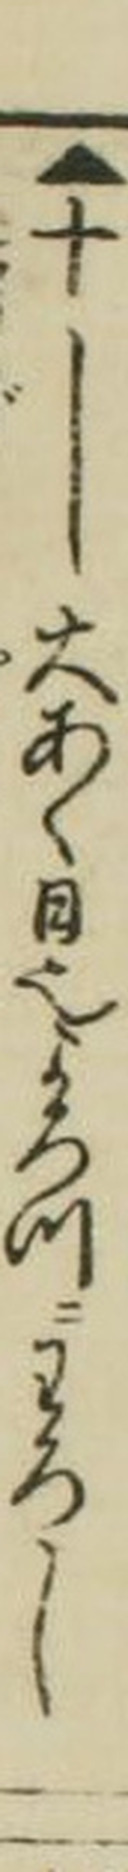▲十し大あく日也よろつにわろし
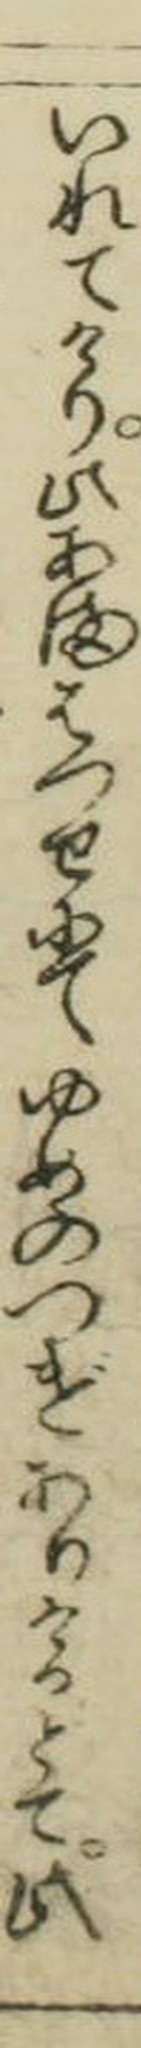いれてけり。此あまはつせにてゆめのつげありけるとて。此
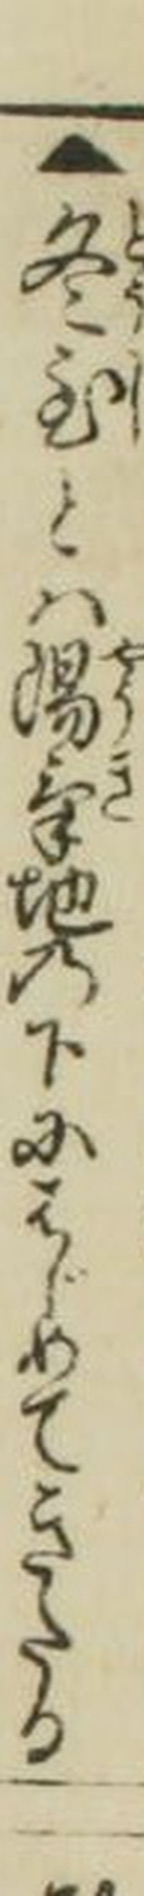▲冬至とは陽気地の下にはじめてきたる
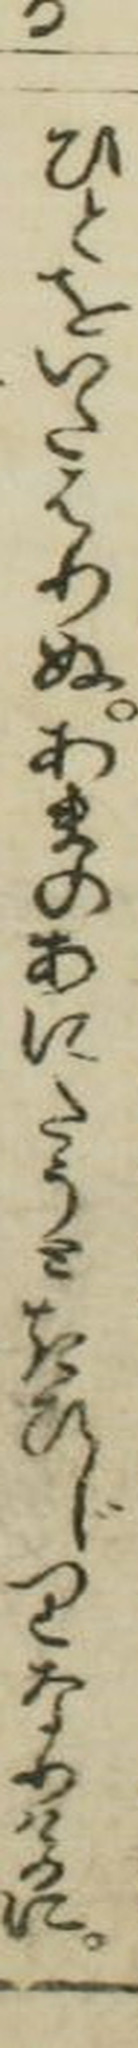ひとをいたはりぬ。あまのあにたうときひじりなりけるに。
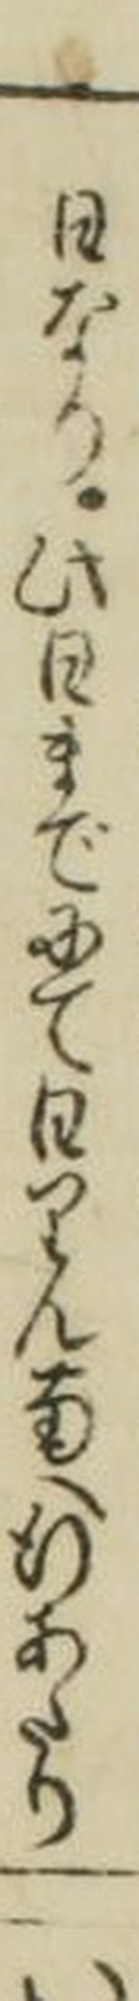日なり。此日までにて日りん南へ行あたり
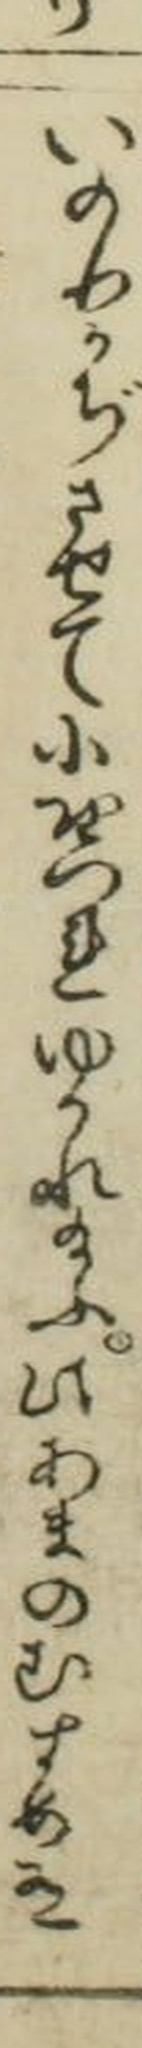いのりかぢさせて小野つれゆかれ給ふ。此あまのむすめ有
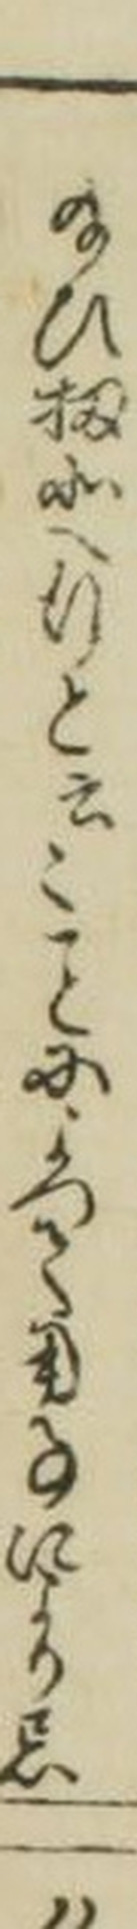給ひ扨北へ行と云ことによつて用事により忌
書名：女源氏教訓鑑
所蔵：東京学芸大学附属図書館
